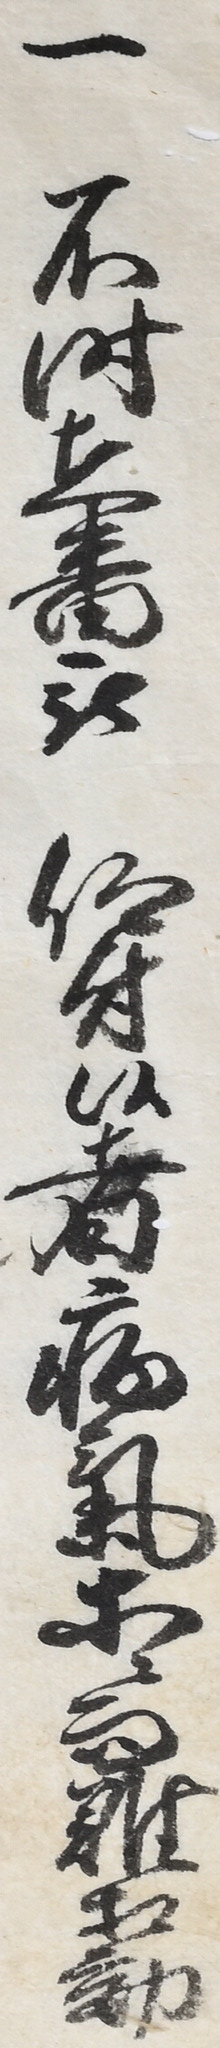一不時在番被仰付候者病気等ニ而難相勤
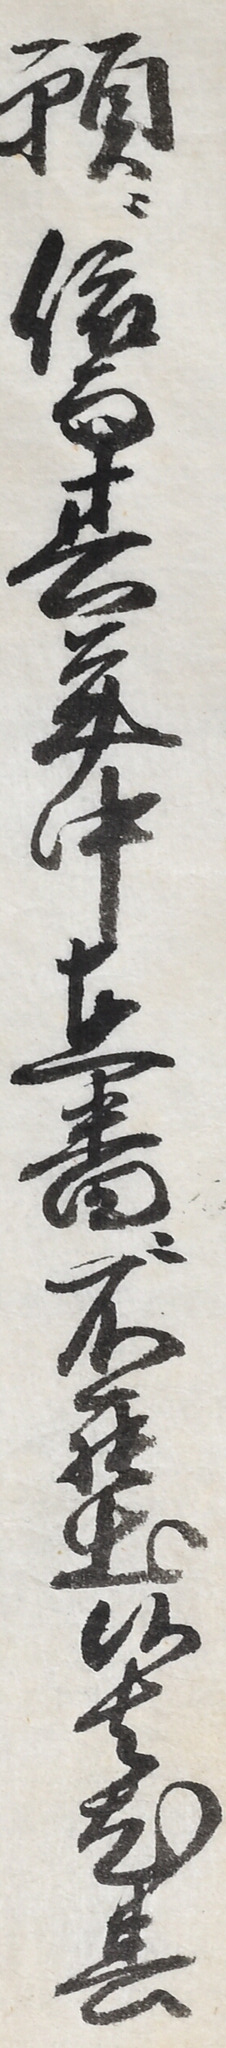願ニ依而其年中在番ニ不罷出候は尤其
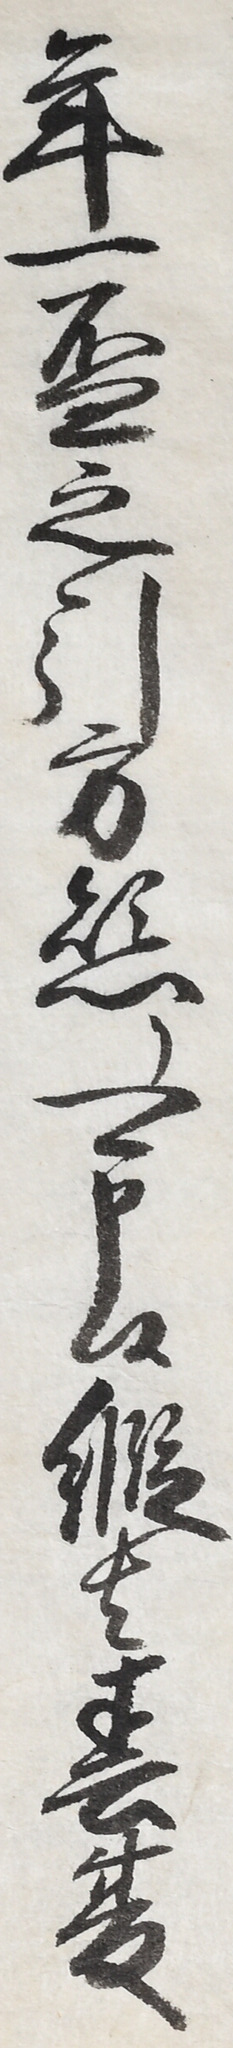年一盃之引方懸リ可申候縦は春夏
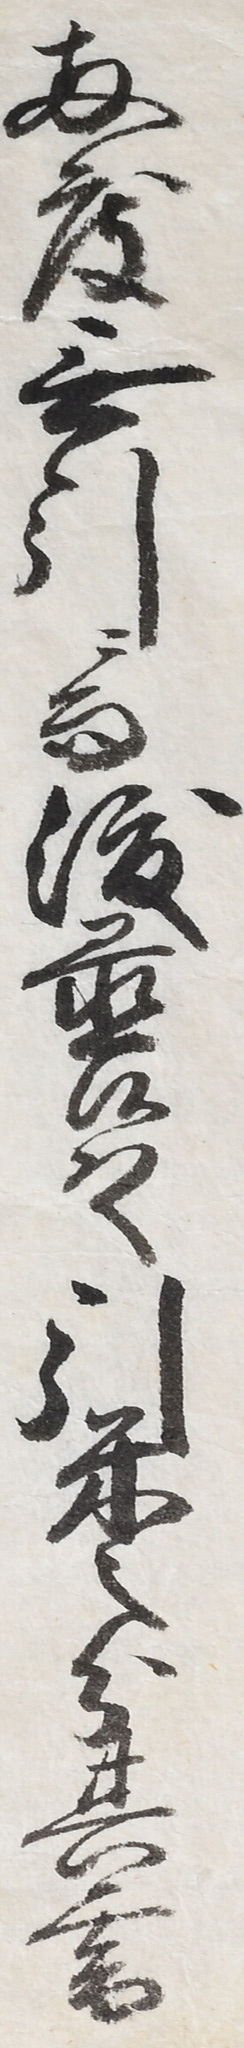両度無引ニ而渡置候ハヽ引米之分其暮
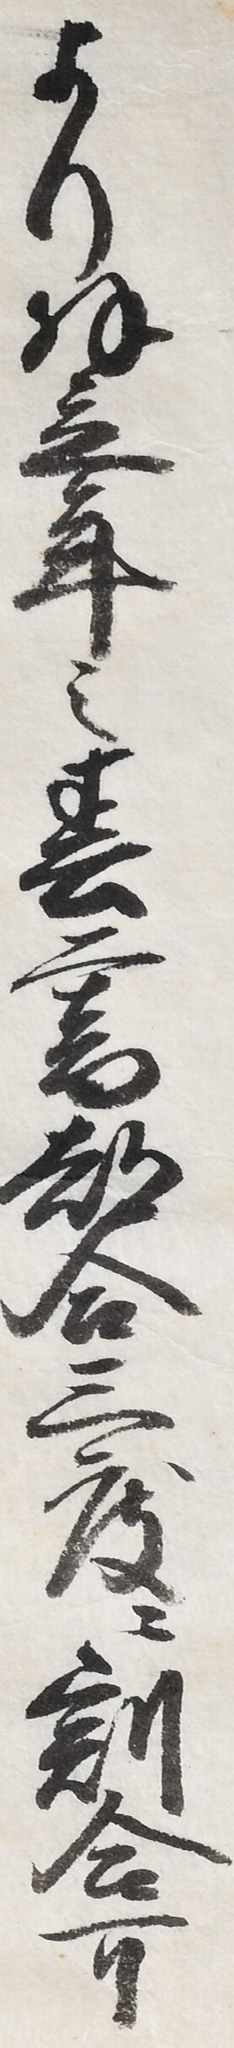より翌年之春暮都合三度ニ割合可
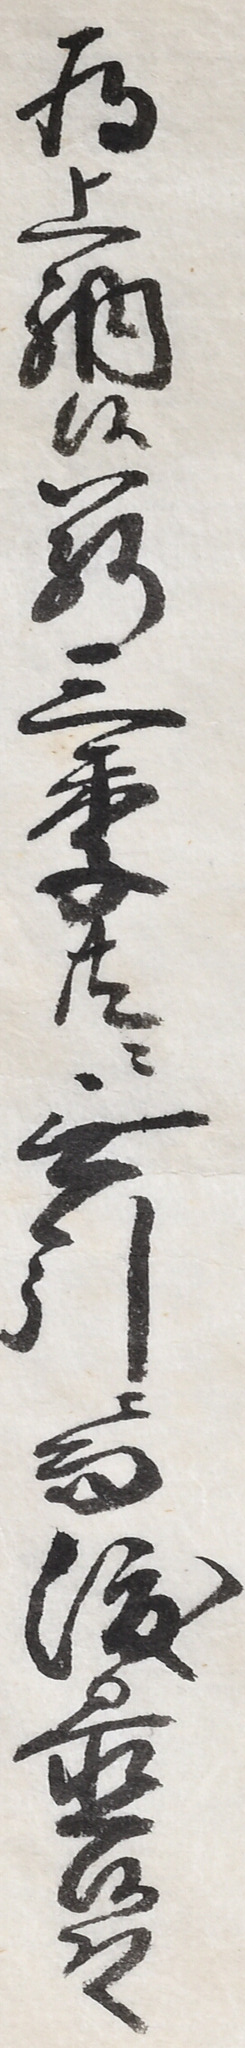為上納候若三季共ニ無引ニ而渡置候ハヽ
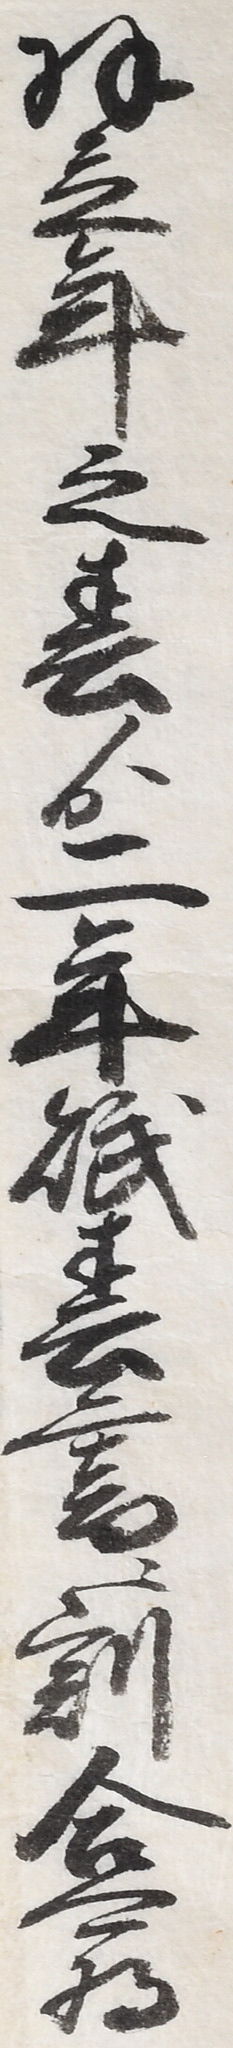翌年之春ゟ二年賦春暮ニ割合可為
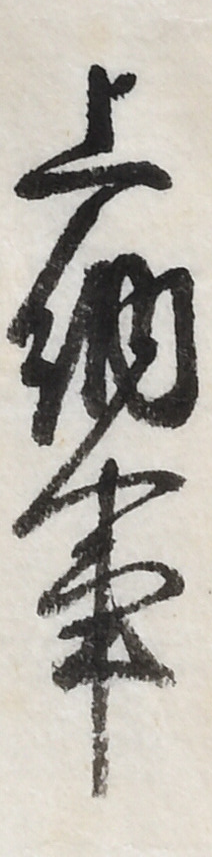上納事
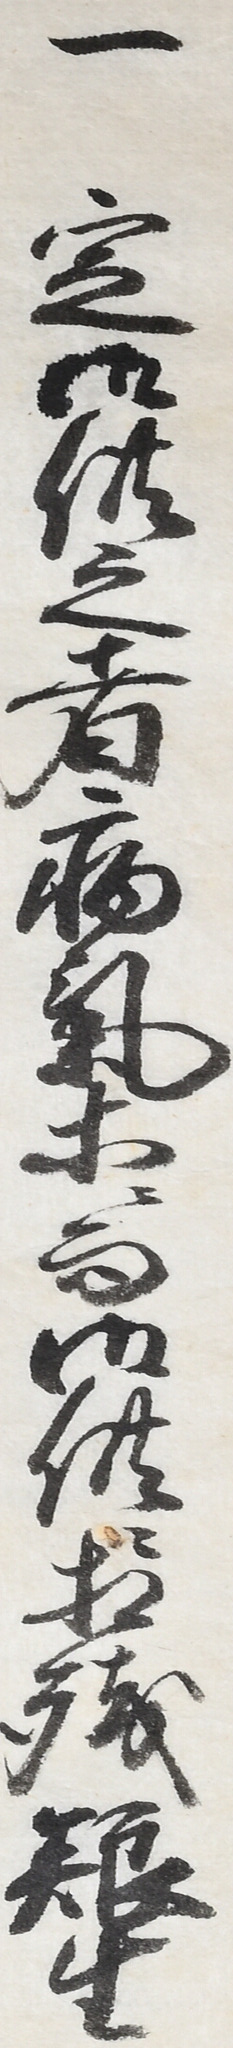一定御供之者病気等ニ而御供ニ相残養生
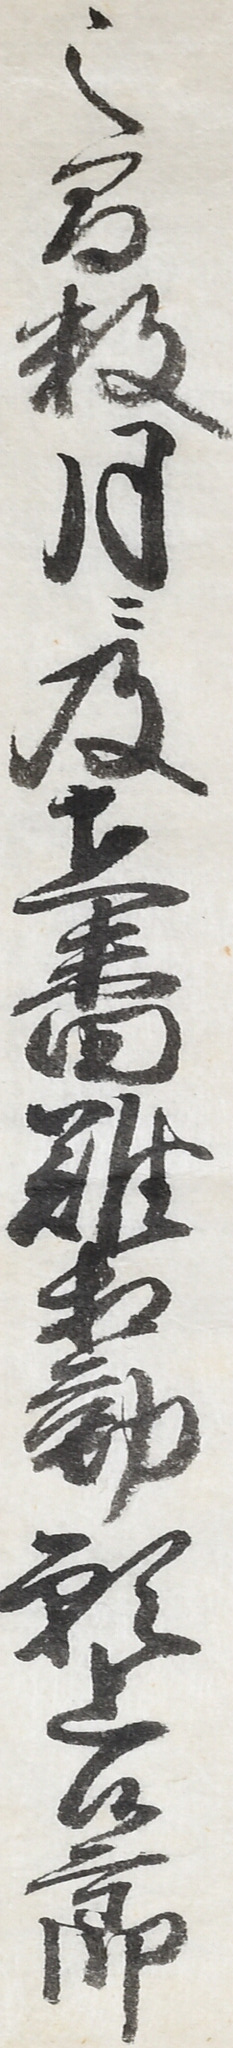之間数月ニ及在番難相勤願上候節
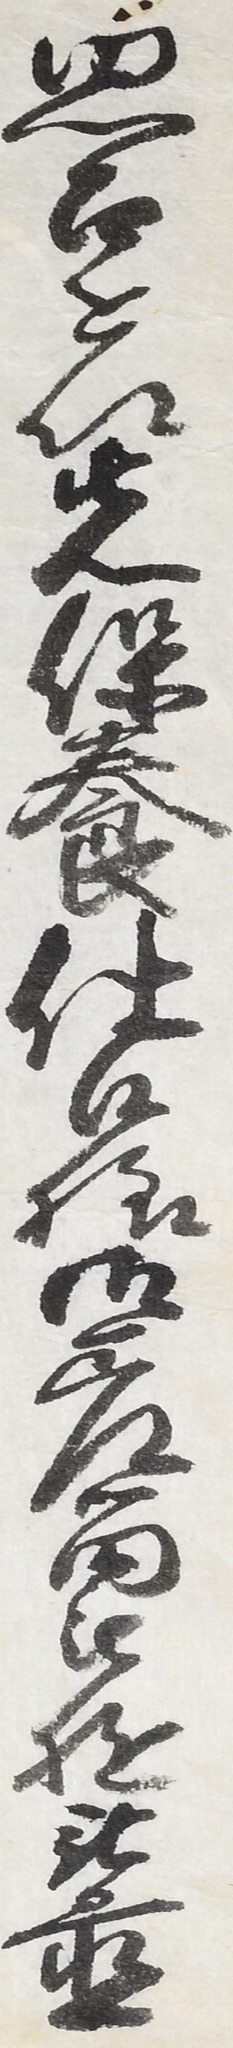思召を以先保養仕候様御差留被遊被置
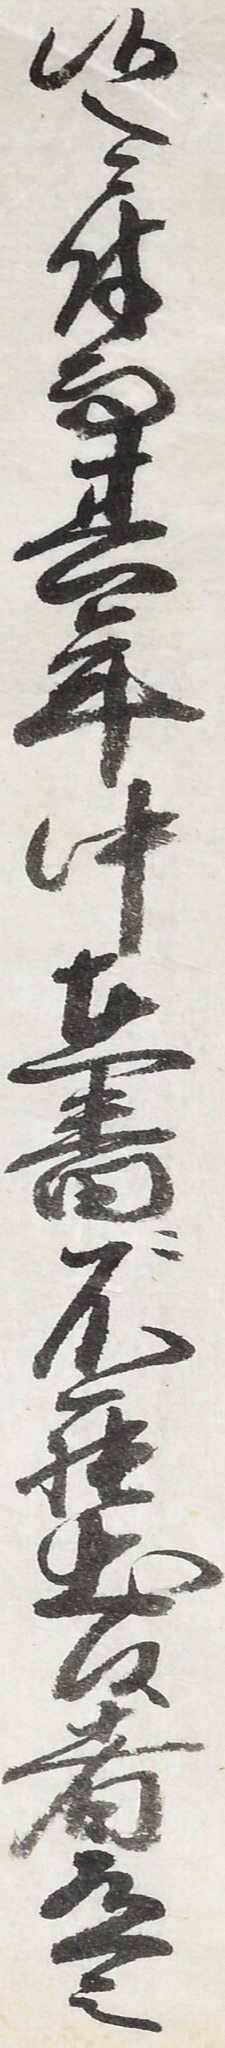候へニ付而其年中在番ニ不罷出候者有之
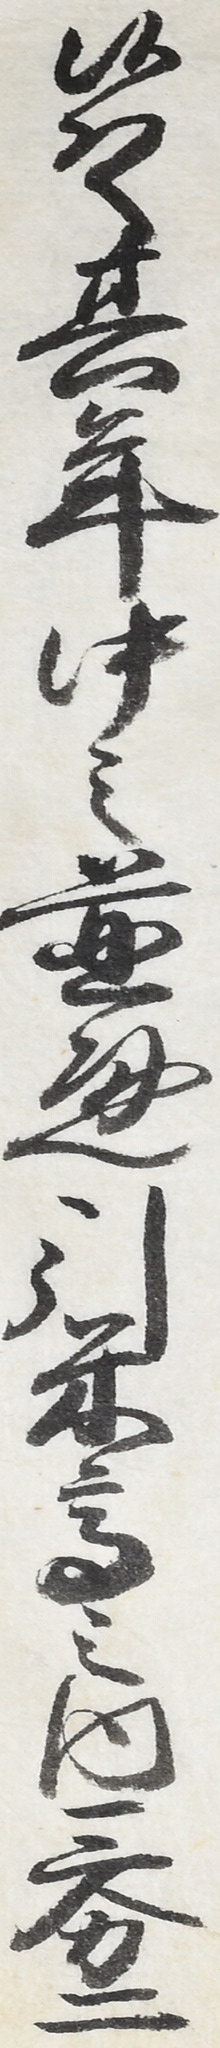候ハヽ其年中之並通引米高之内三分二
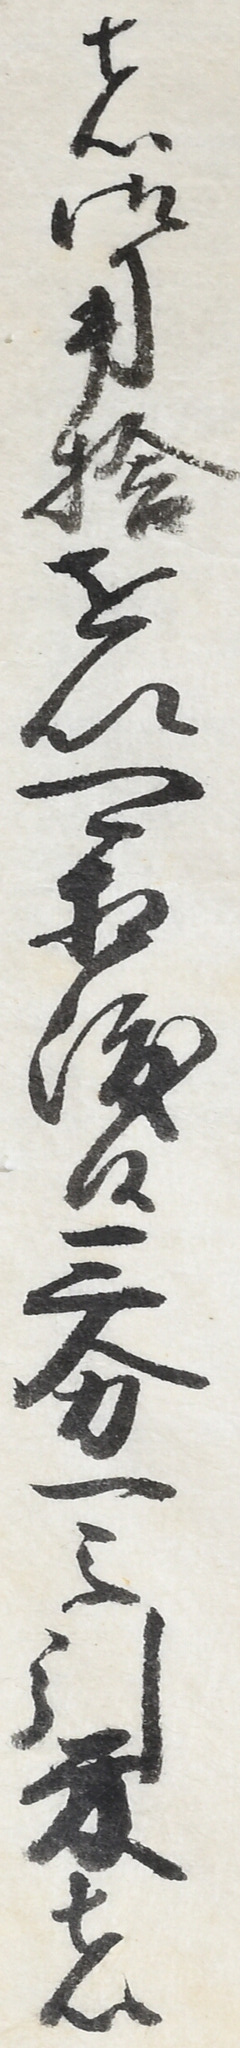は御用捨を以可相渡候三分一之引米は

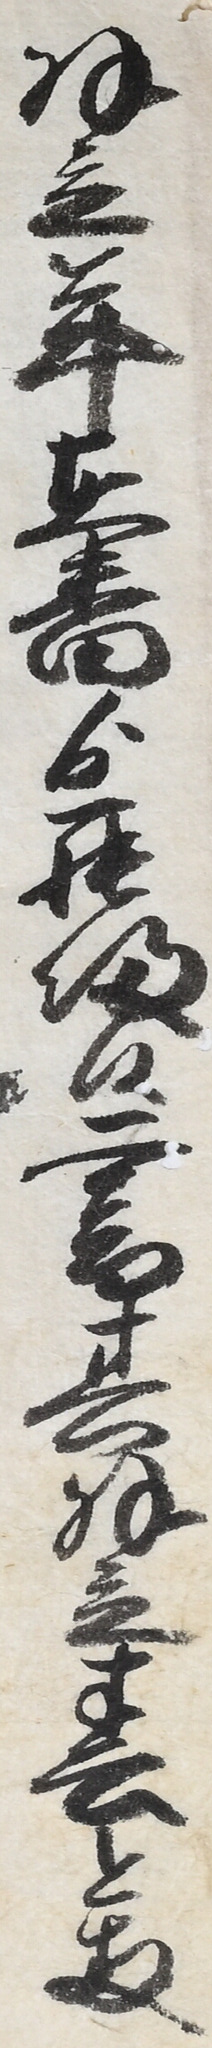翌年在番ゟ罷帰候暮其翌春と両
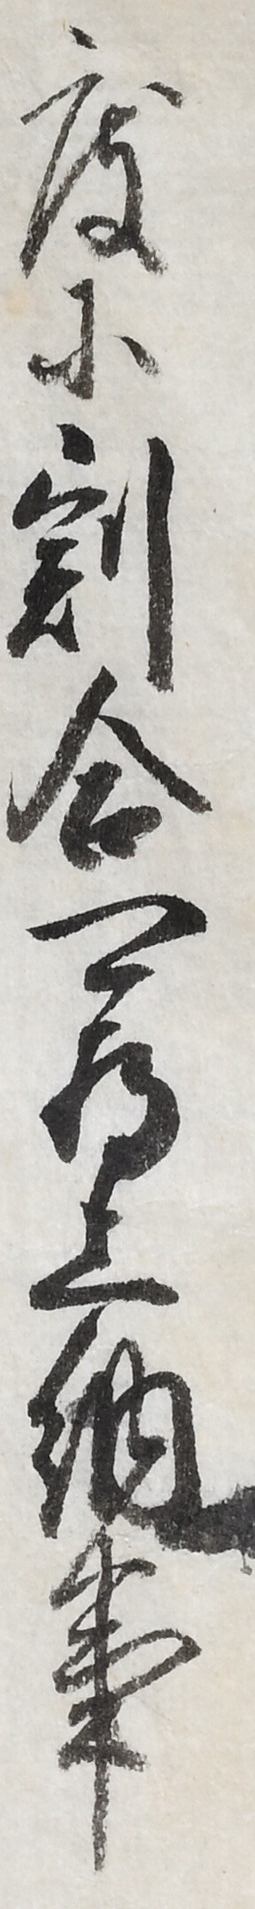度に割合可為上納事
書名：御給分渡り方定追加
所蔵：伊那市立高遠町図書館・合同会社AMANE
